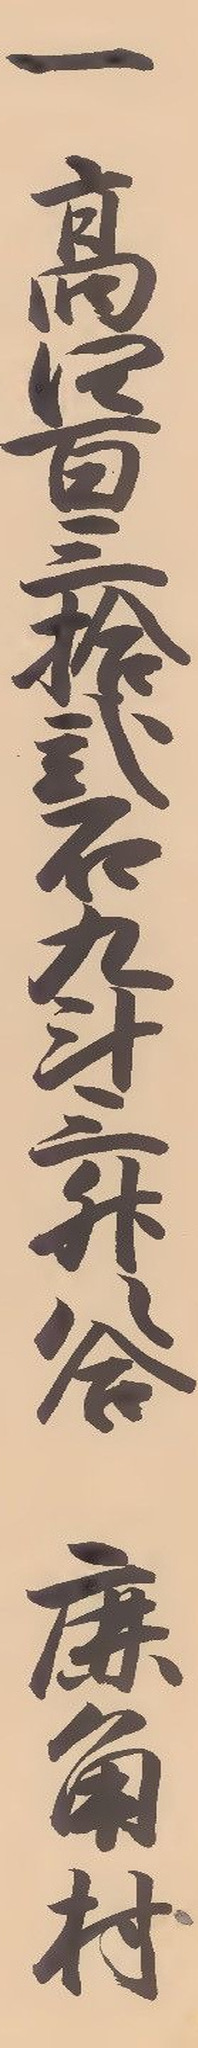一高四百三拾弐石九斗三升八合鹿角村
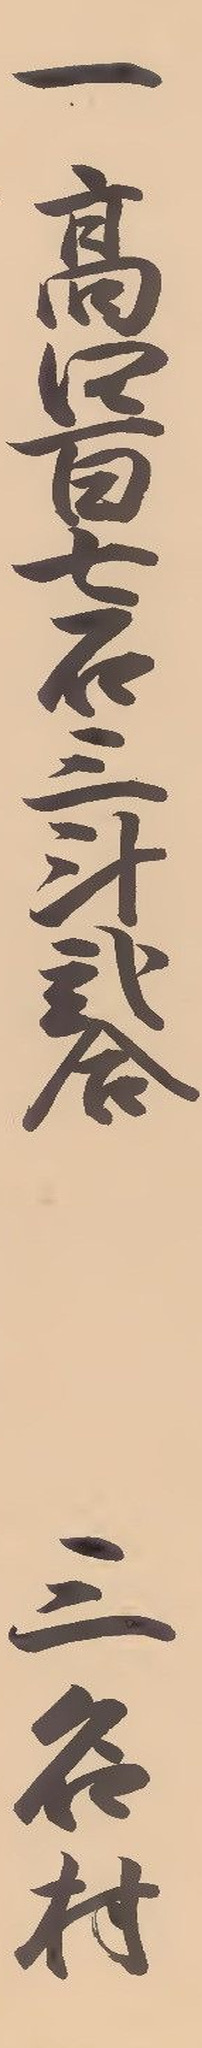一高四百七石三斗弐合三名村
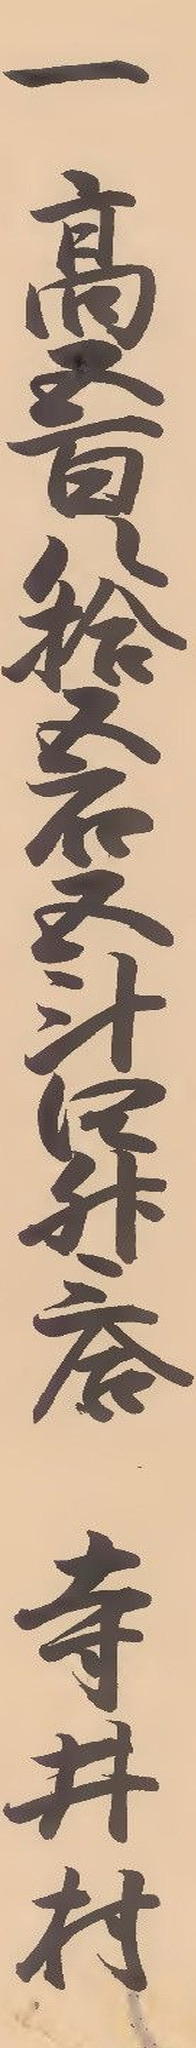一高五百八拾五石五斗四升三合寺井村
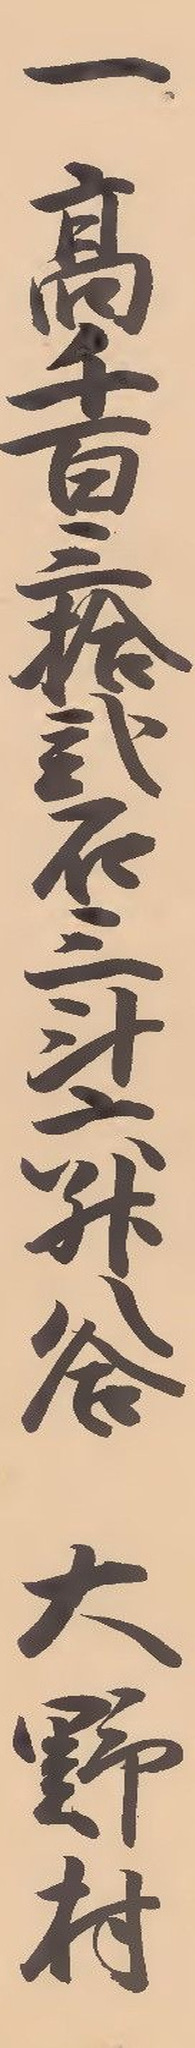一高千百三拾弐石三斗六升八合大野村
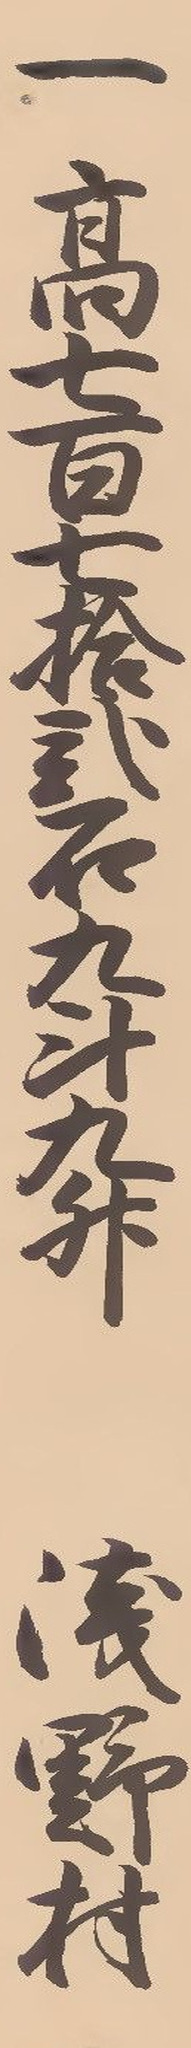一高七百七拾弐石九斗九升浅野村
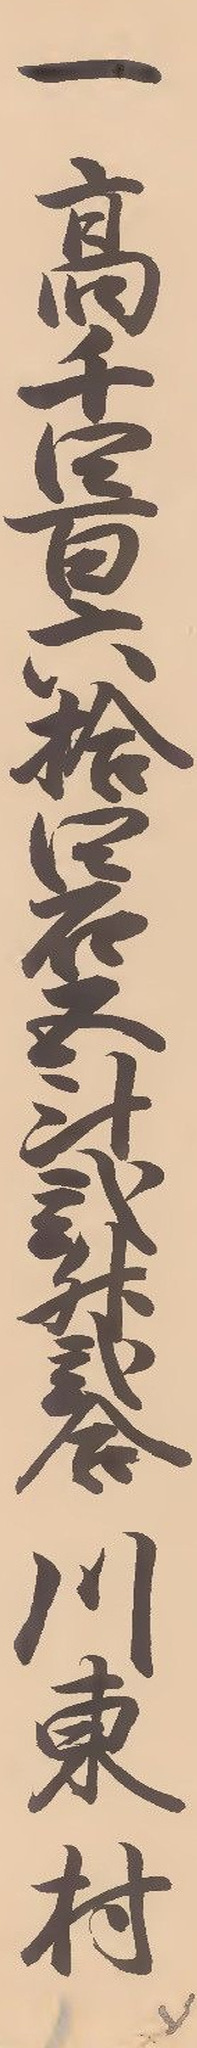一高千四百六拾四石五斗弐升弐合川東村
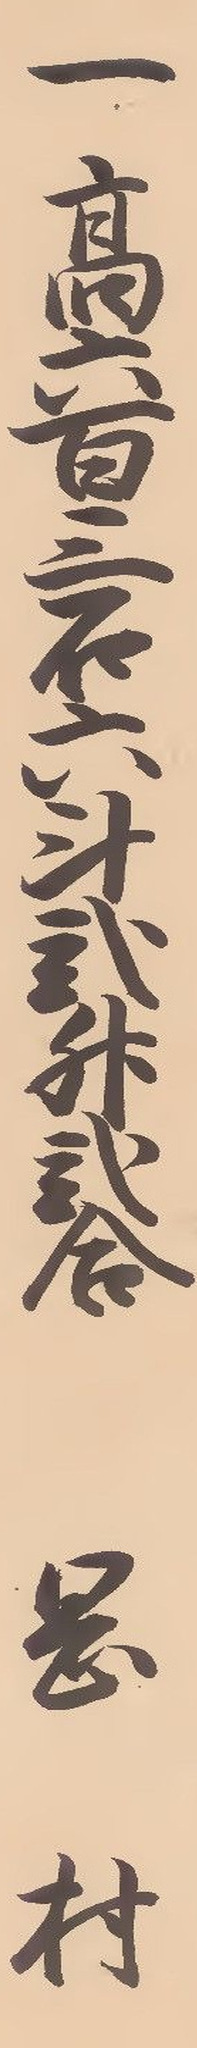一高六百三石六斗弐升弐合岡村
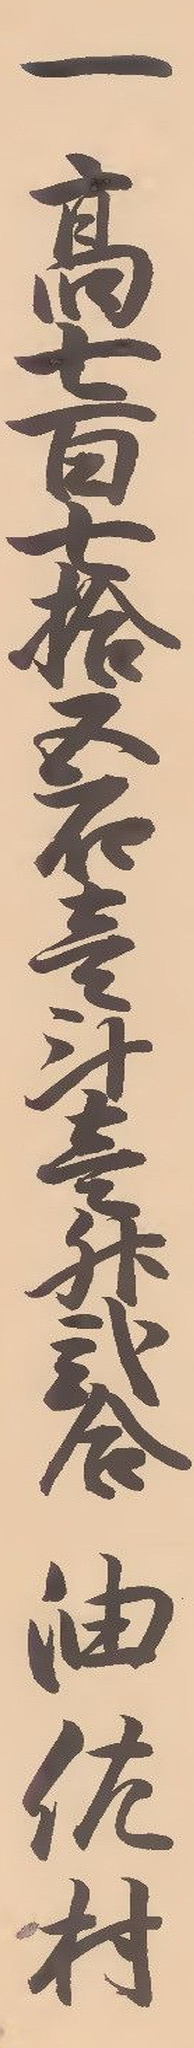一高七百七拾五石壱斗壱升弐合油佐村

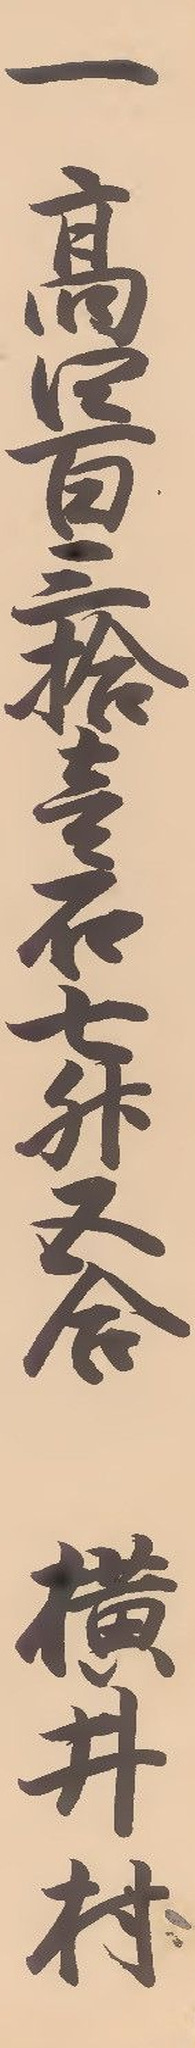一高四百三拾壱石七升五合横井村
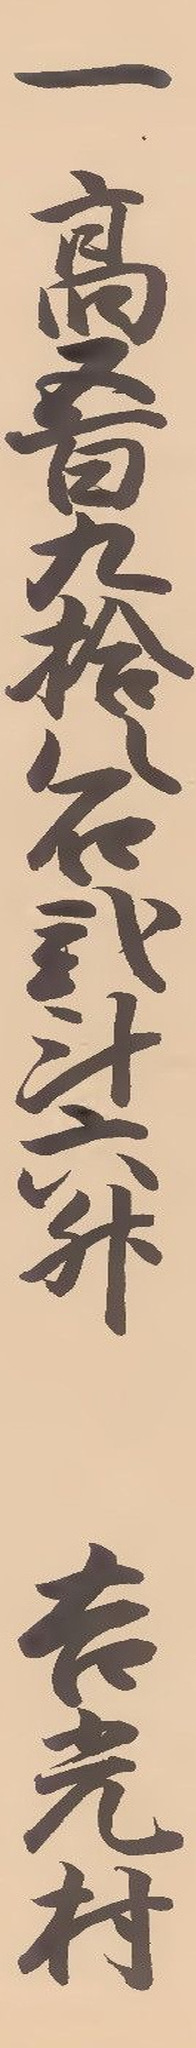一高五百九拾八石弐斗六升吉光村
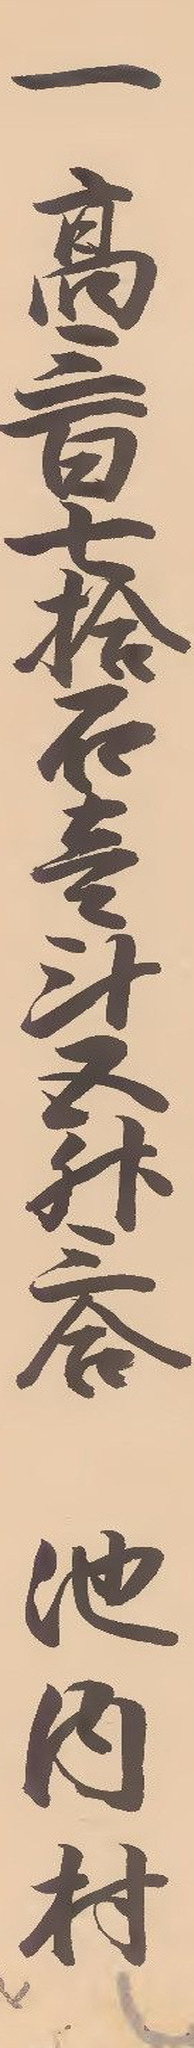一高三百七拾石壱斗五升三合池内村
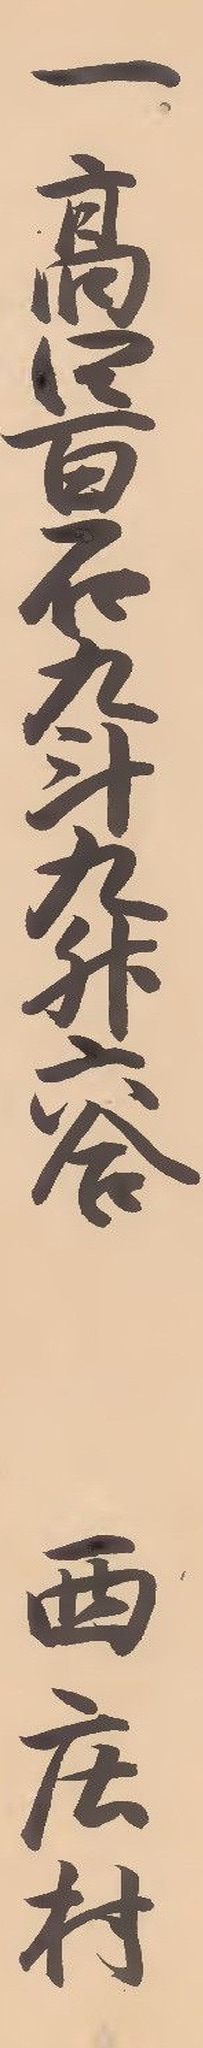一高四百石九斗九升六合西庄村
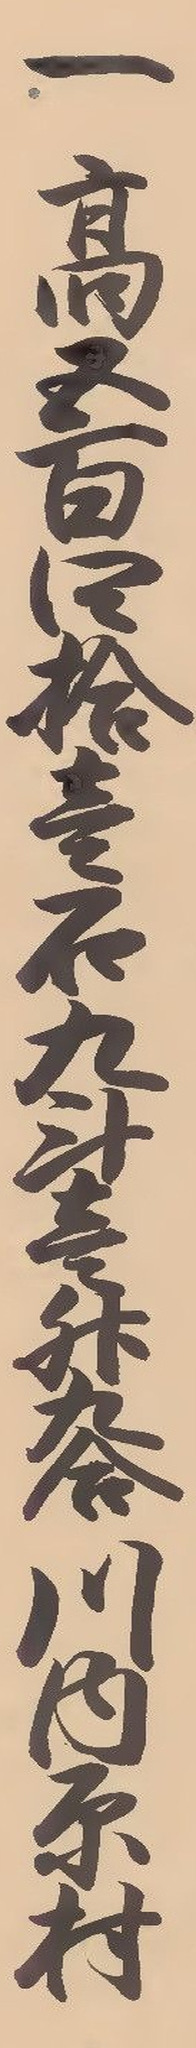一高五百四拾壱石九斗壱升九合川内原村
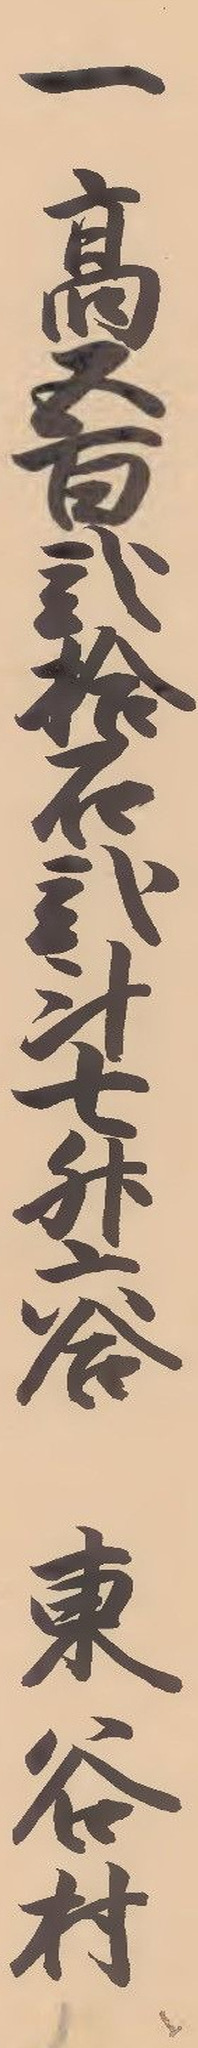一高五百弐拾石弐斗七升六合東谷村
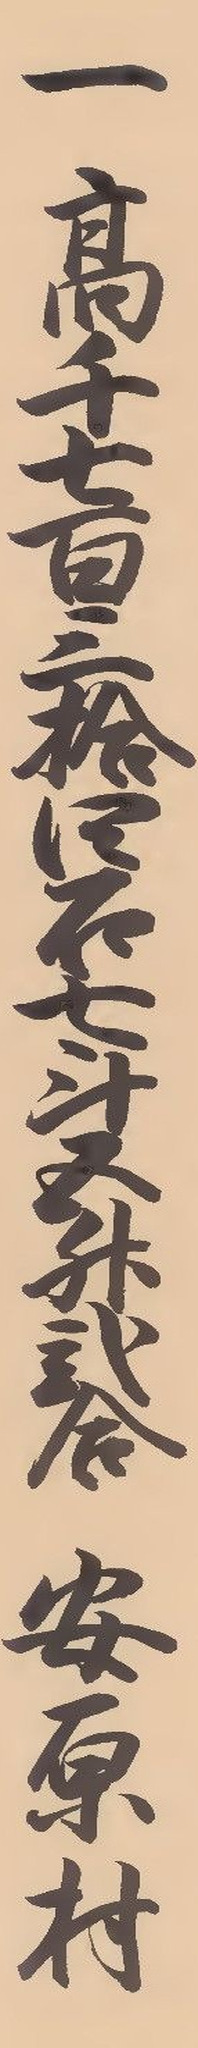一高千七百三拾四石七斗五升弐合安原村
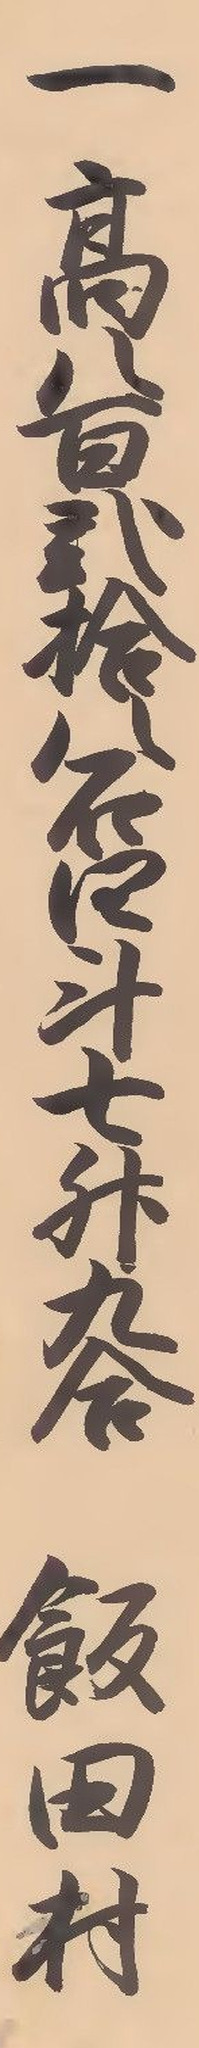一高八百弐拾八石四斗七升九合飯田村
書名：讃岐国郷帳
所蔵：国立公文書館 National Archives of Japan
